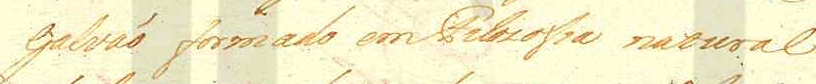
Galvaõ formado em Filozofia natural
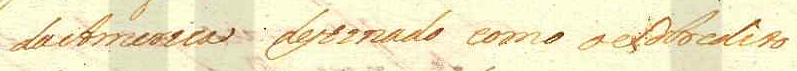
da America destinado como o sobredito
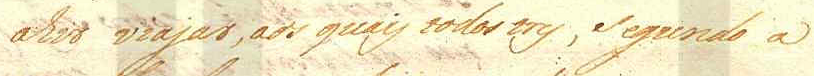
a hir viajar, aos quais todos tres, segundo a
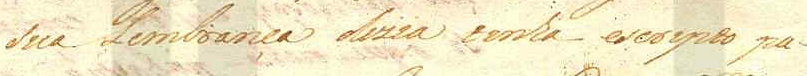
sua Lembrança dizia tinha escripto pa
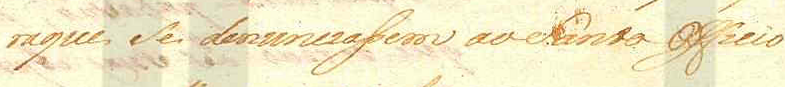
ra que se denunciassem ao Santo Officio
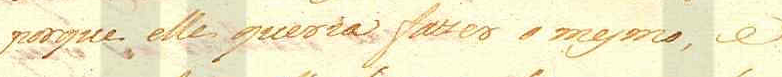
porque elle queria fazer o mesmo, e
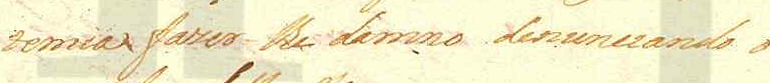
temia fazer lhe damno denunciando o
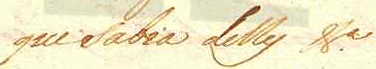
que sabia delles &a.
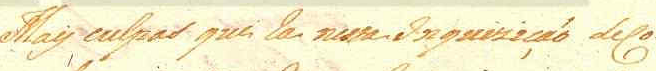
Mais culpas que ha nesta Inquiziçaõ de Co
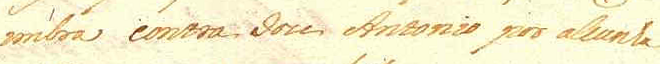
imbra contra Ioze Antonio por alcunha
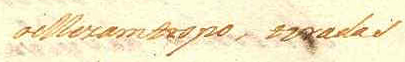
a Mezamtropo, tiradas
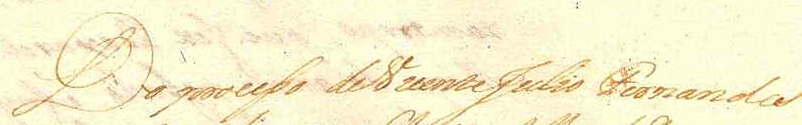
Do processo de Vicente Julio Fernandes
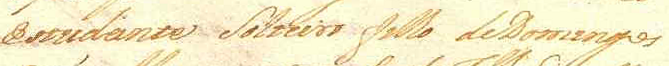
estudante solteiro filho de Domingos
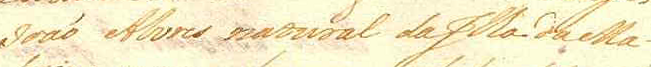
Ioaõ Alvres natural da Jlha da Ma
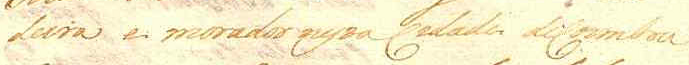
deira e morador nesta Cidade de Coimbra
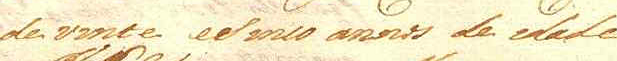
de vinte e sinco annos de idade
